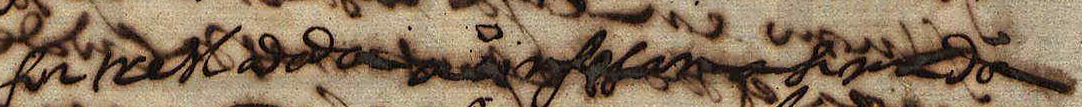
foi trelladada a confesam asinada
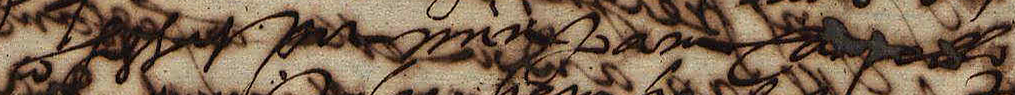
cōfessos por mim Joam Campello
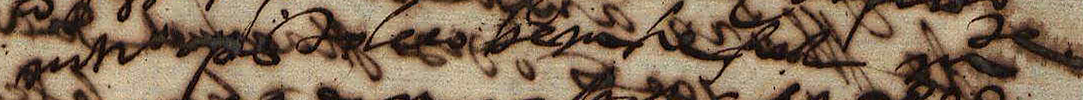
notro apostolico bem he fielmte
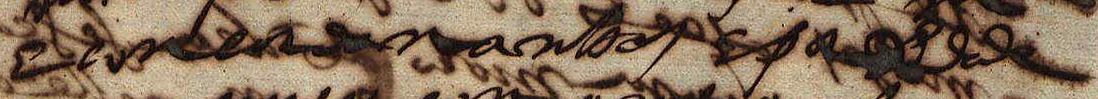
E concorda na notas E por ꝟdade
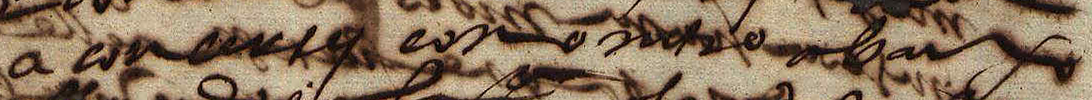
a concertei com o notro abaiXo
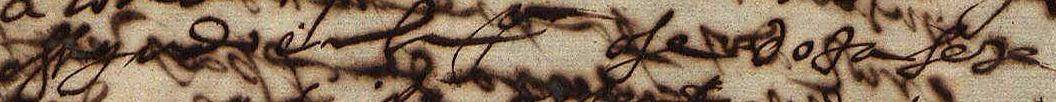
assignado en Lxa oJe dosasete
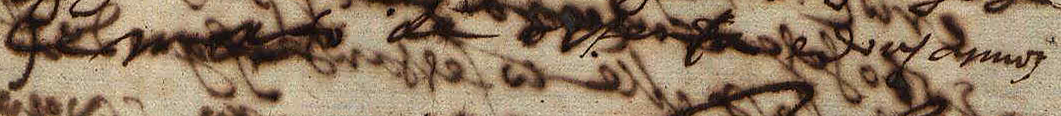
de maio de oitenta e dous annos
